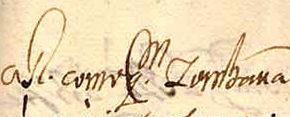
a R. como q.m zombaua
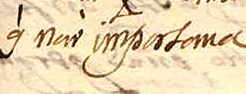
q̄ naõ importaua
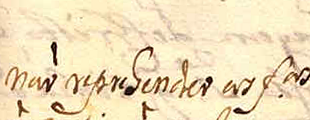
naõ reprehendeo as f.as
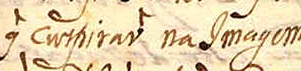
q̄ cuspiraõ na Imagem
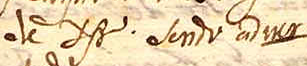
de xpo. sendo a aduer
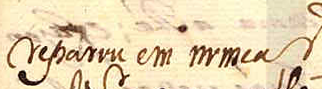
reparou em nomear
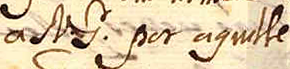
a N. Sr. por aquelle
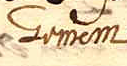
homem
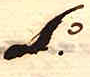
1.o
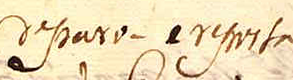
deparo e reposta
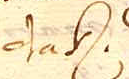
da R.
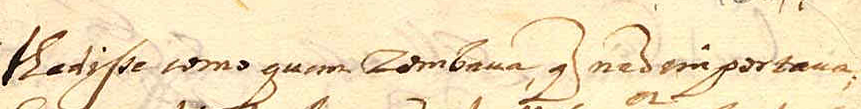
lhe disse como quem zombaua, q̄ naõ importaua,
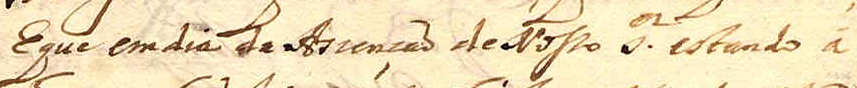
E que em dia de Ascenção de Nosso S.or estando á
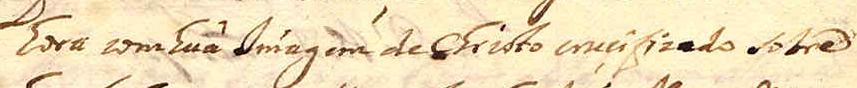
hora com huā Imagem de Christo crucificado sobre
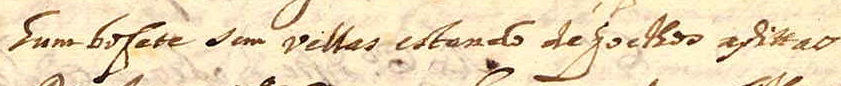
hum bofete sem vellas estando de Joelhos as dittas
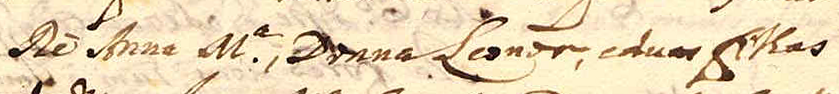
Ré Anna M.a, Donna Leonor, e duas filhas
